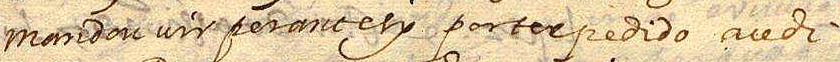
mandou uir perante sy por ter pedido audi
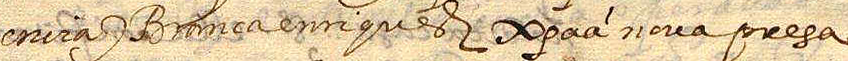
encia, Branca enriques xpaā noua presa
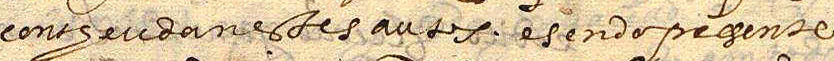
contheuda nestes autos e sendo presente
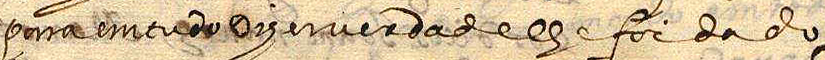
para em tudo dizer uerdade lhe foi dado
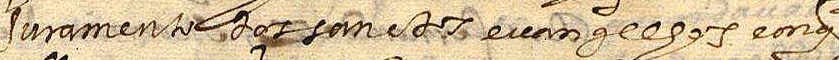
Juramento dos sanctos euangelhos em q̄
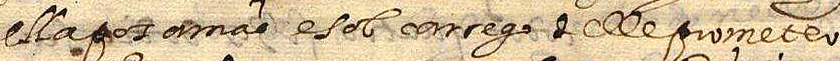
ella pos a maõ e sob carrego delle prometeo
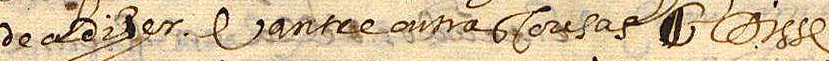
de a dizer. e antre outras Cousas ⁋ Disse
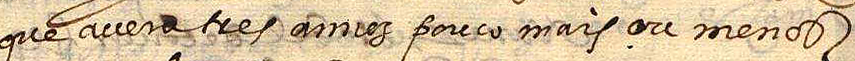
que auera tres annos pouco mais ou menos
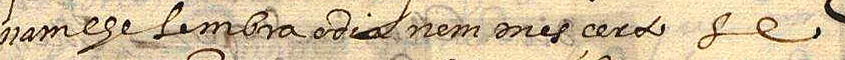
nam lhe lembra o dia nem mes certo se
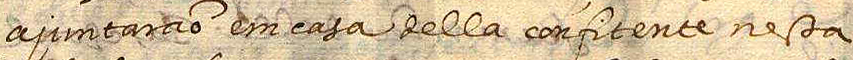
ajuntaraõ em casa della confitente nesta
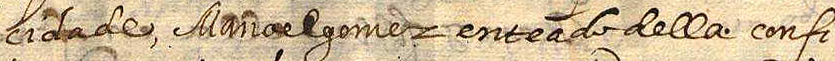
cidade, Manoel gomez enteado della confi
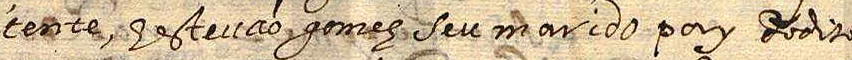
tente, E esteuaõ gomez seu marido pay do dito
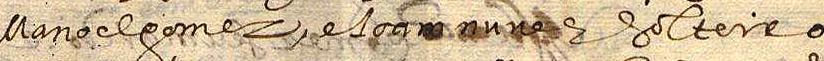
Manoel gomez, e Ioam nunes E solteiro
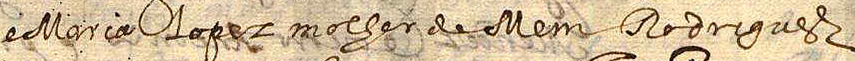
e Maria lopez molher de Mem Rodrigues
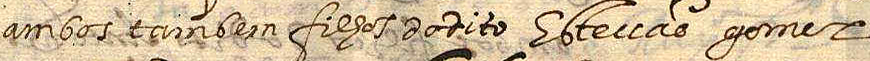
ambos tambem filhos do dito Esteuaõ gomez
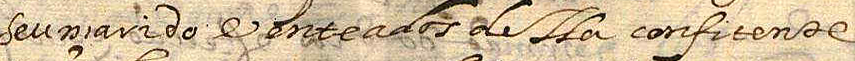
seu marido e enteados della confitente
